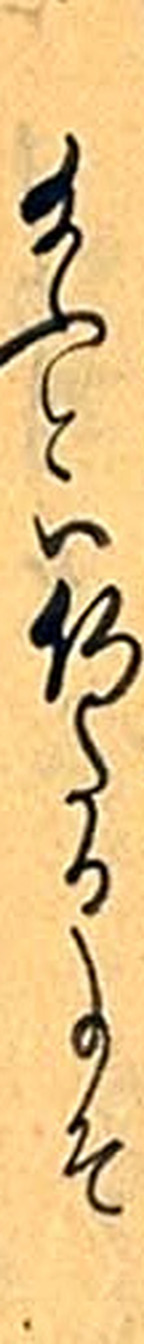給ふとは何たる事そ
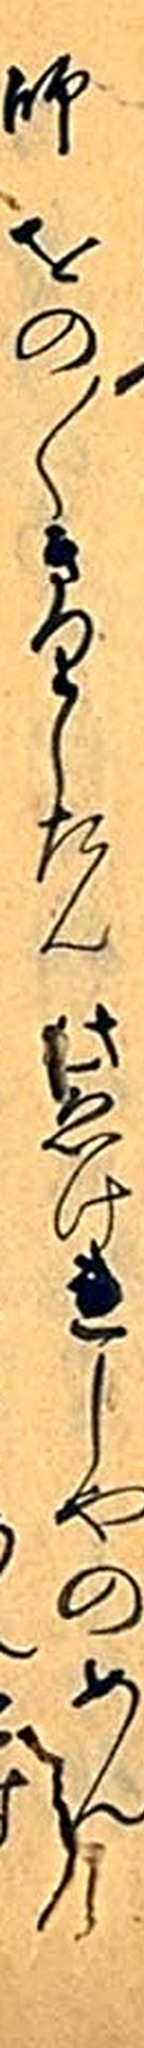師をの〳〵きりしたん此ゑけれしやのめん
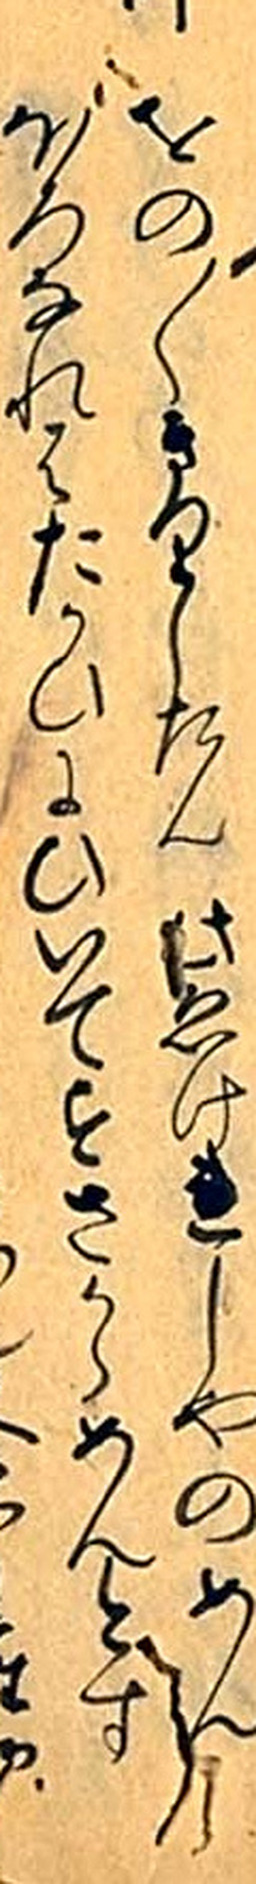ほろなれはたかひにひいてすさからめんとす
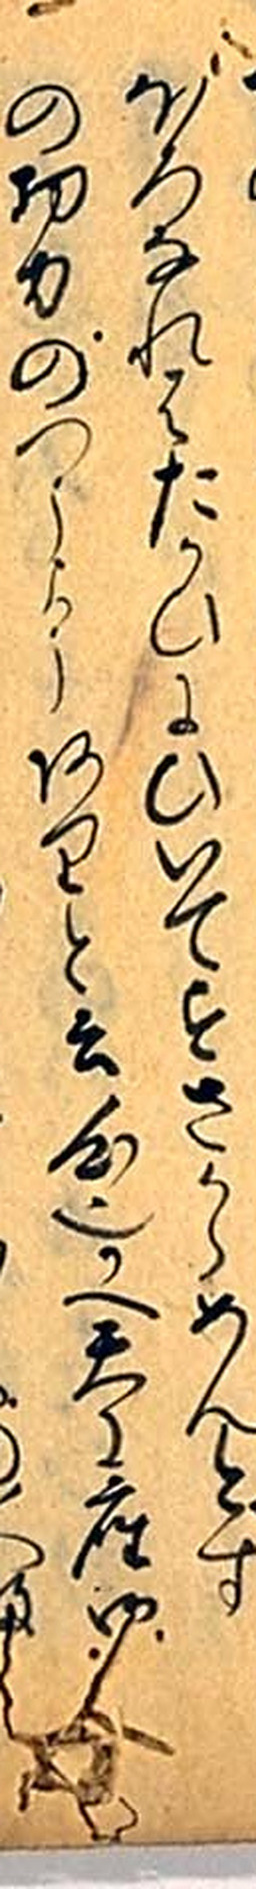の功力のつうようありと云心也又天に座御
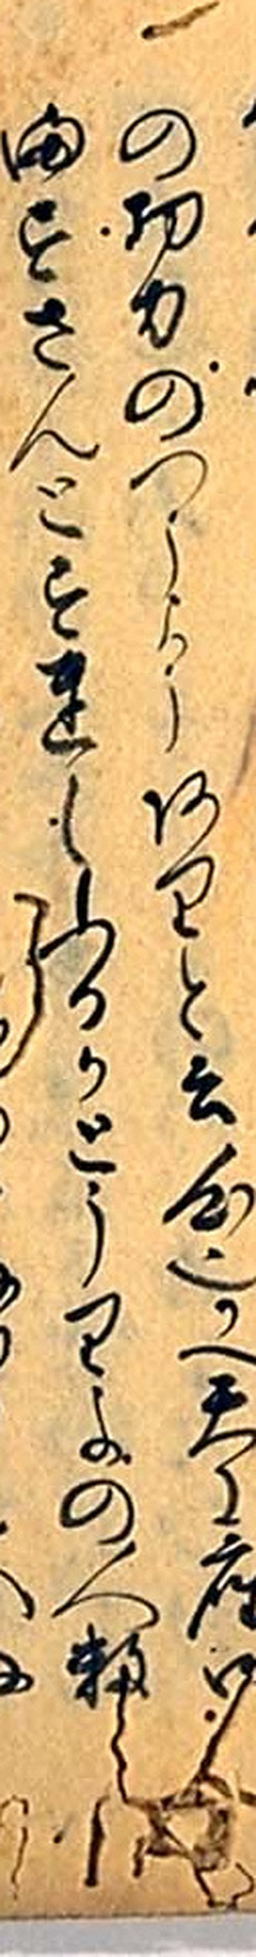ますさんとす達もふるかとうりよの人数
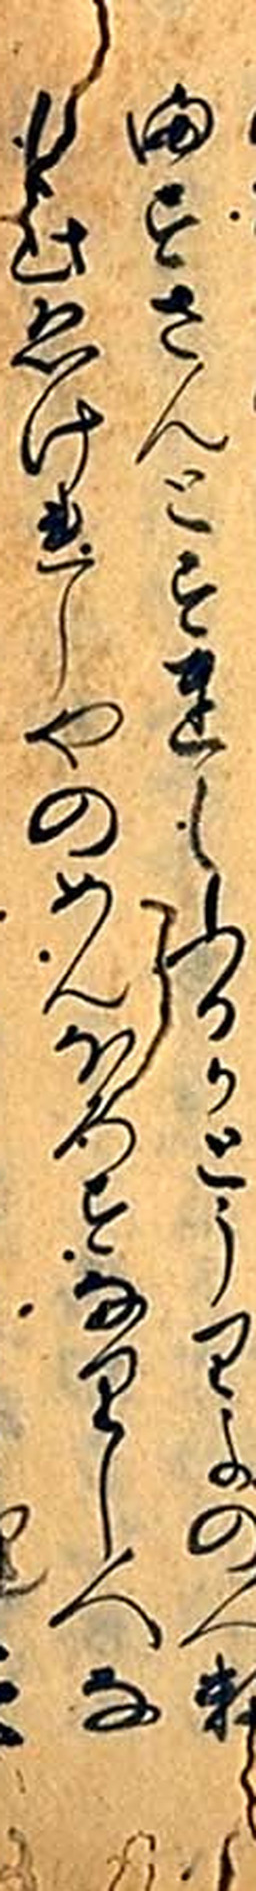も此ゑけれしやのめんほろすなりし人な
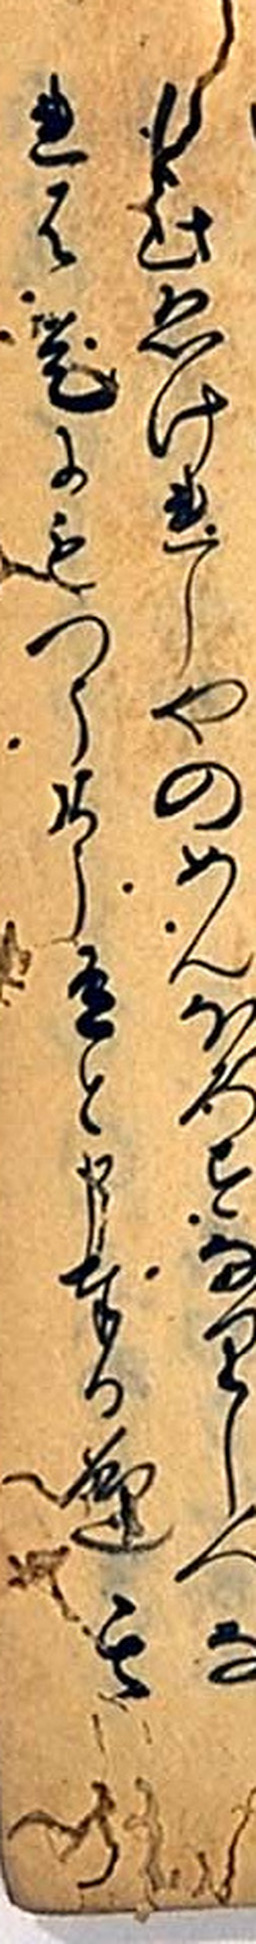れは是にもつうよう有と申奉る心也其

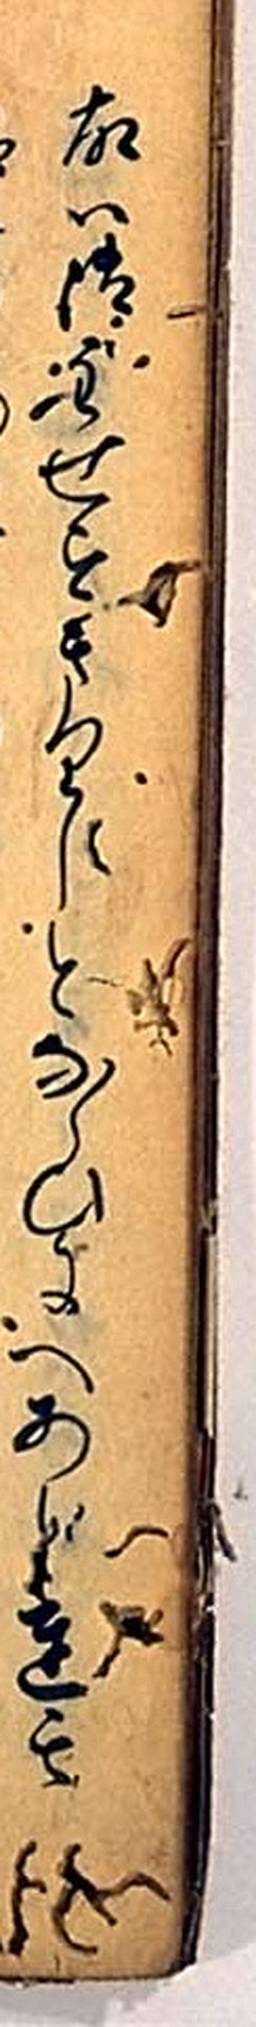故は御主せすきりしとならひにへあと達其
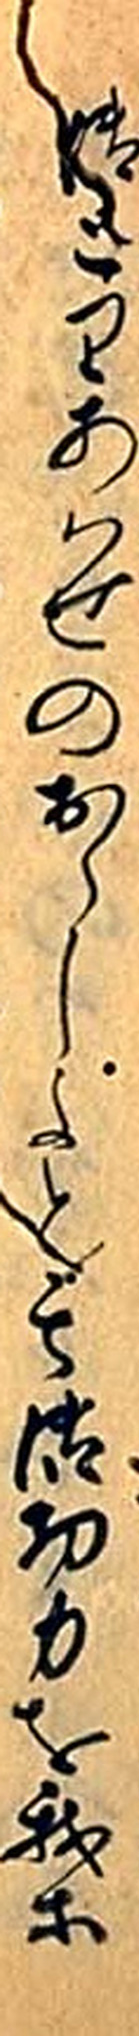御とりあはせのおらしよと其御功力を我等
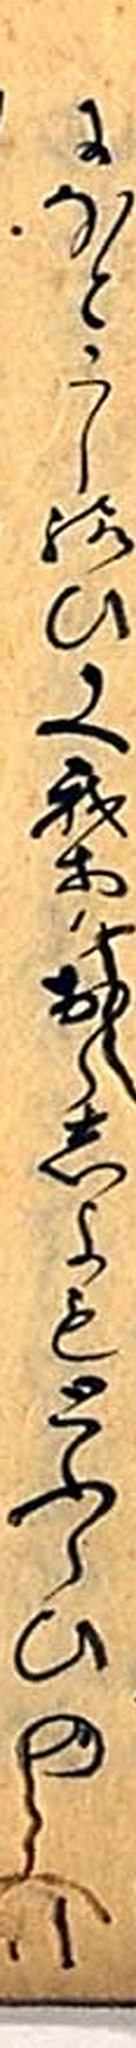にほとこし給ひ又我等かおらしよもとふらひの
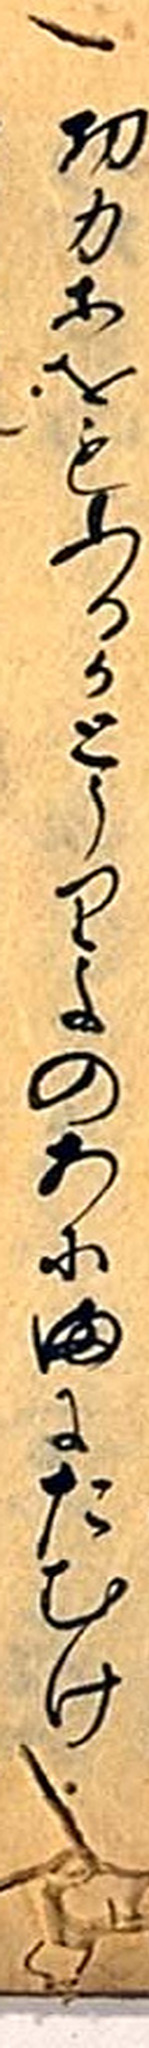功力等をもふるかとうりよのあにまにたむけ
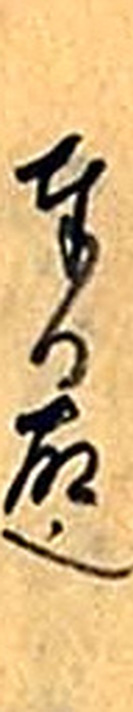奉る故也
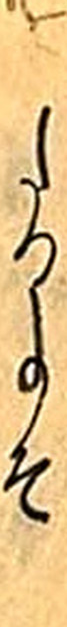たる事そ
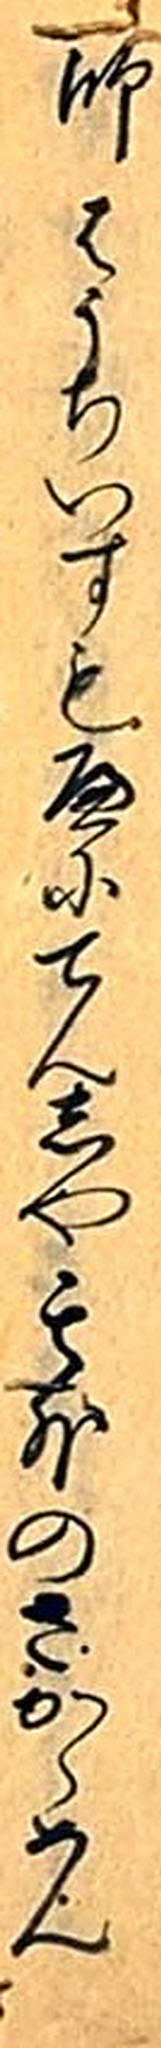師はうちいすもへにてんしや其外のさからめん
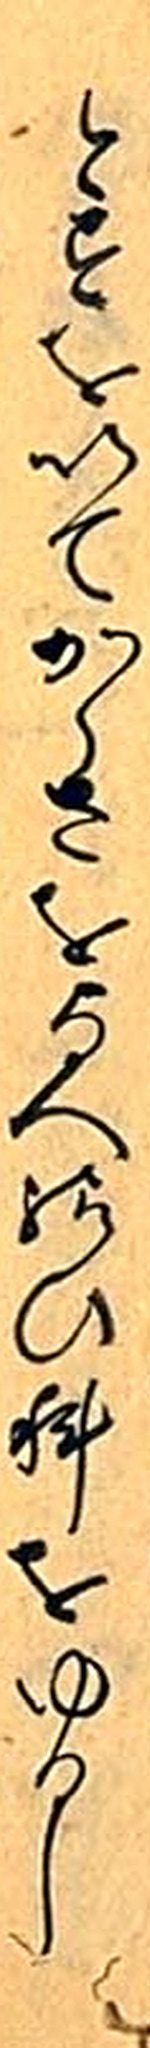とすを以てからさを与へ給ひ科をゆるし
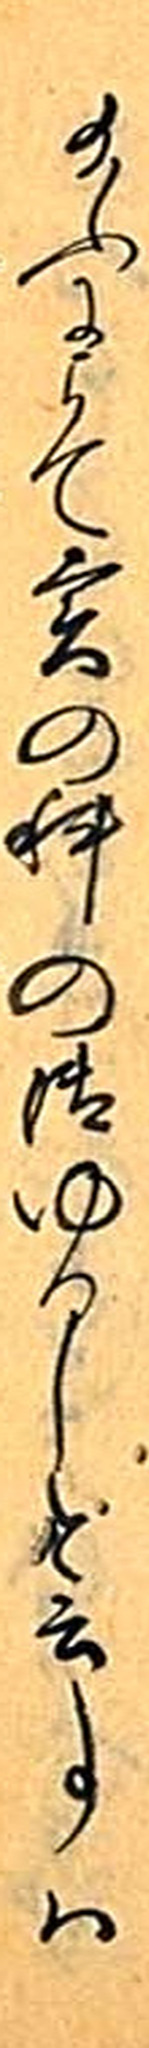給ふによて実の科の御ゆるしと云事は
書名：ドチリナ・キリシタン
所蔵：東京大学総合図書館 / General Library in the University of Tokyo
